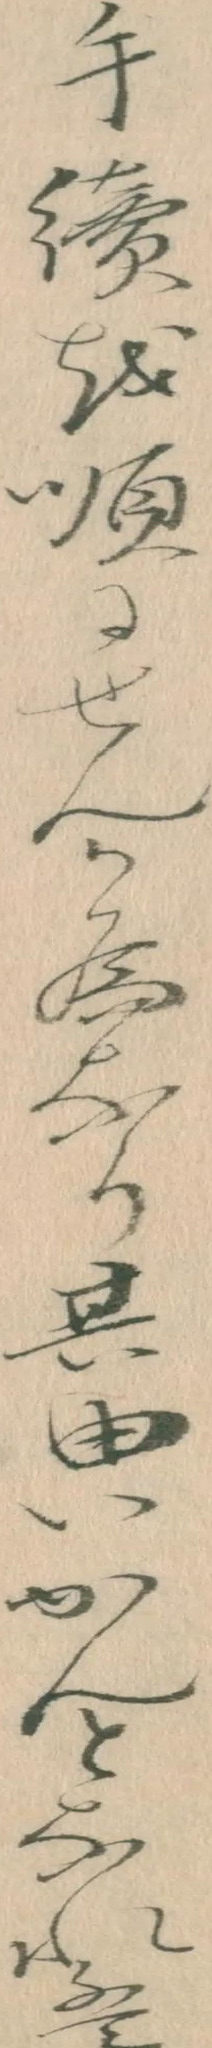手続を順にせんか為なり其由いかんとなれは
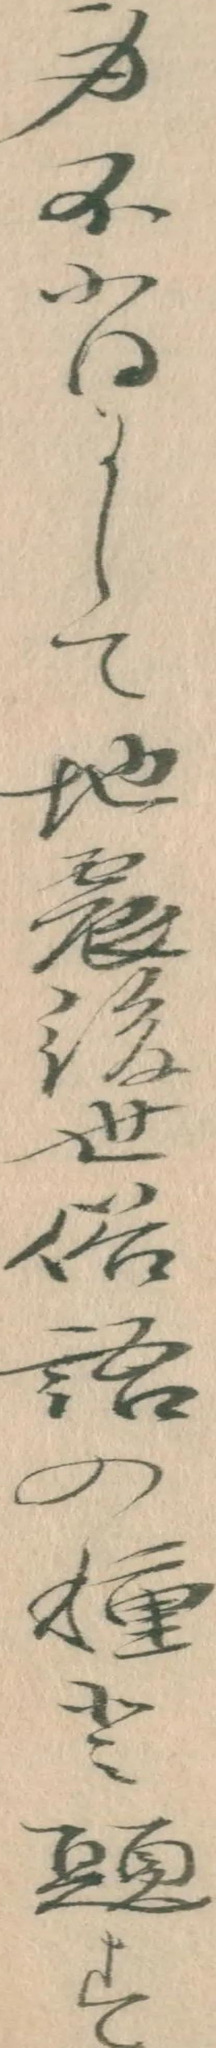身不肖にして地震後世俗語の種と題す
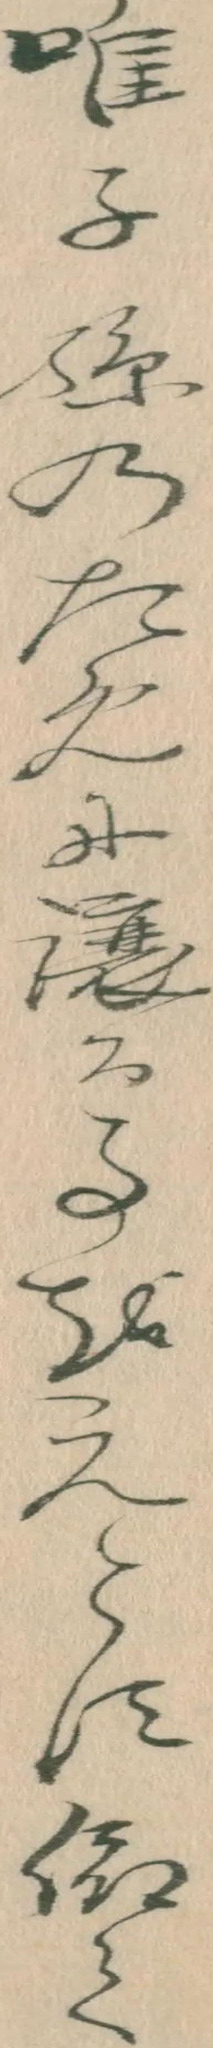唯子孫のために譲る事を元とす依て
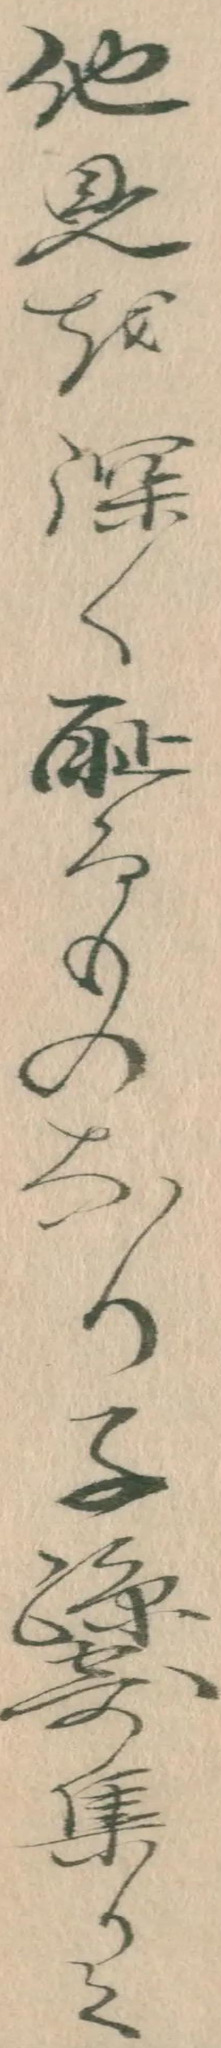他見を深く恥るものなり子孫寄集りて
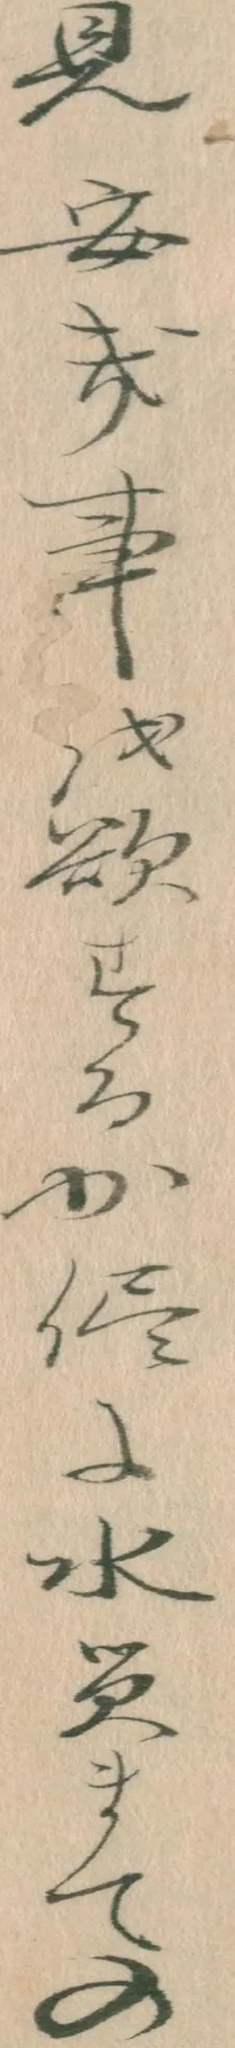見安き事を欲するか侭に水災まての
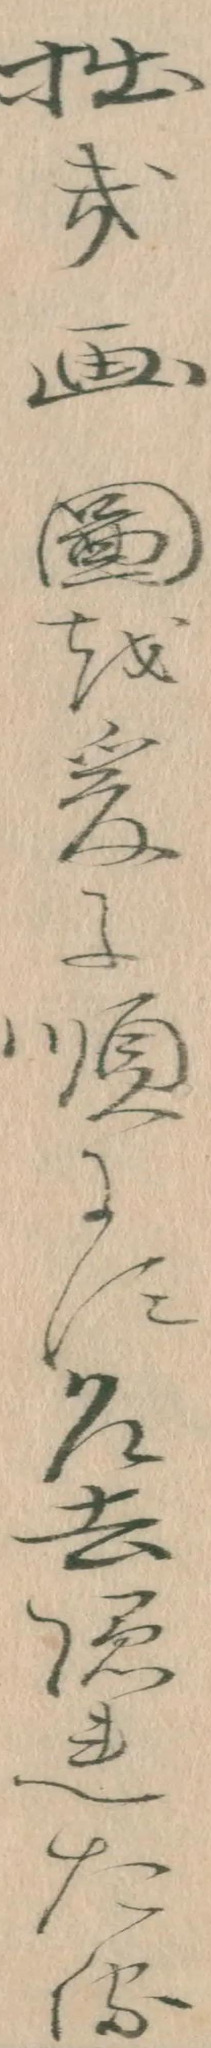拙き画図を爰に順にす乍去隠れたる
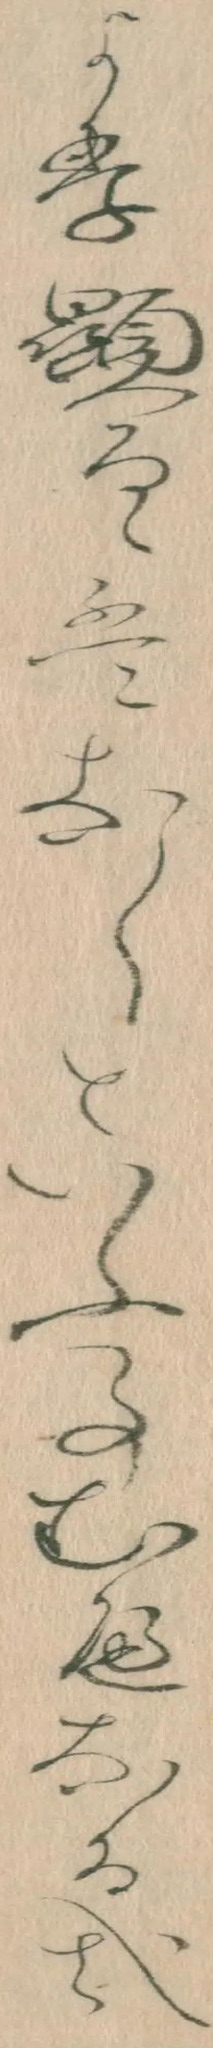より顕るゝはなしといふ事むへなる哉
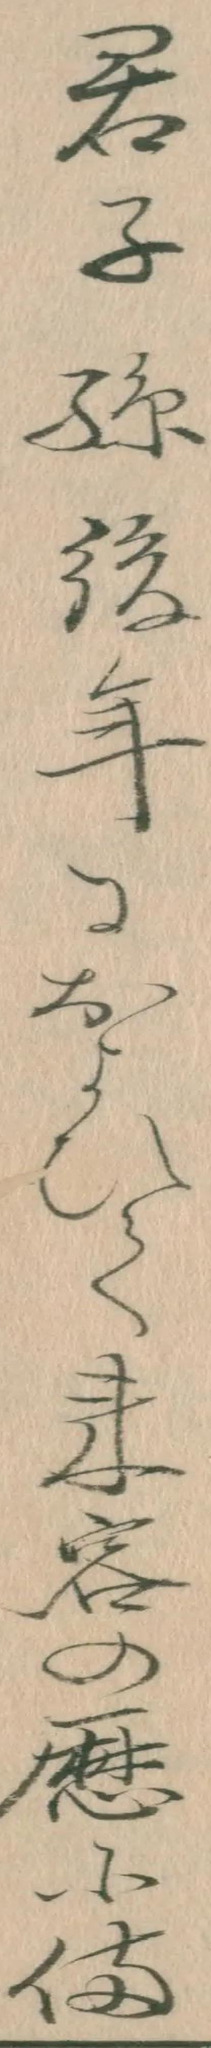若子孫後年におよひて来客の歴に備
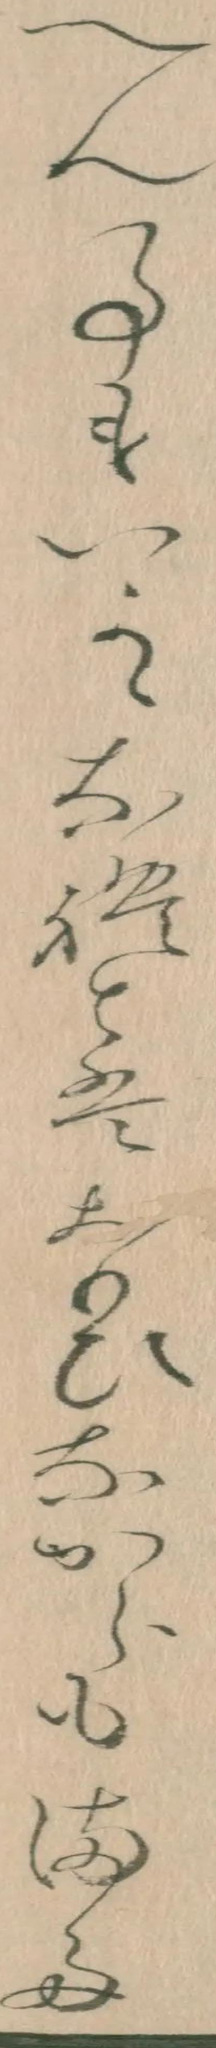へん事もいかゝなれとはおもひなからもまた
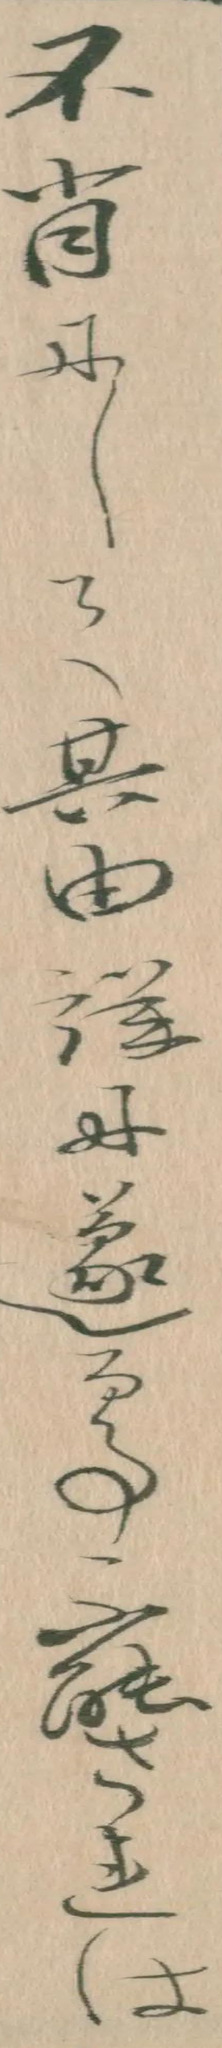不肖にして其由詳に遂る事不能されは
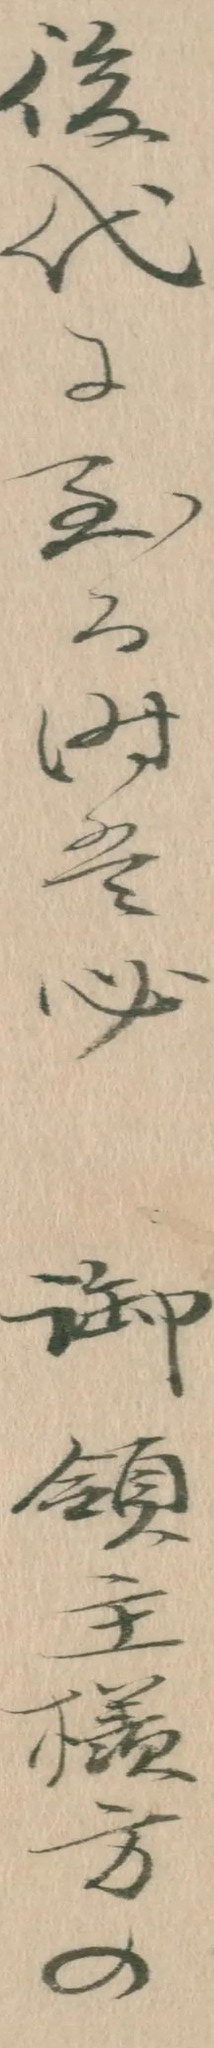後代に至る時は必御領主様方の
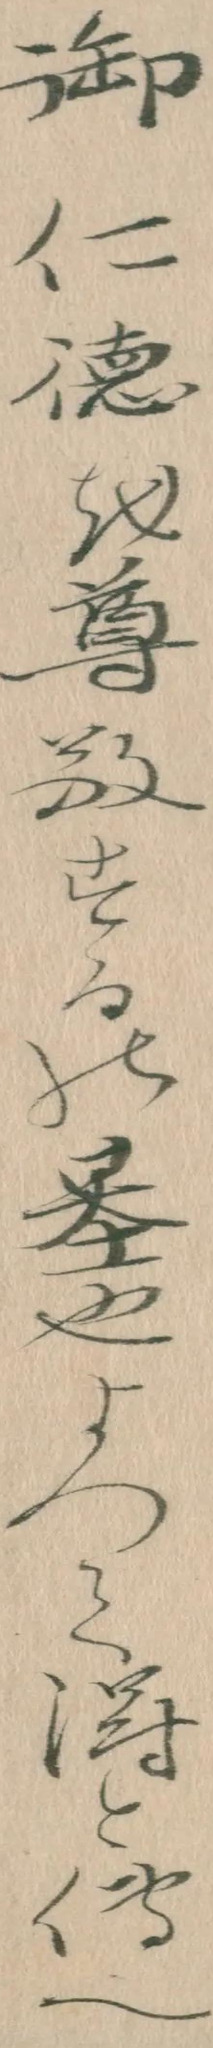御仁徳を尊敬するの基也よつて得と伝へ
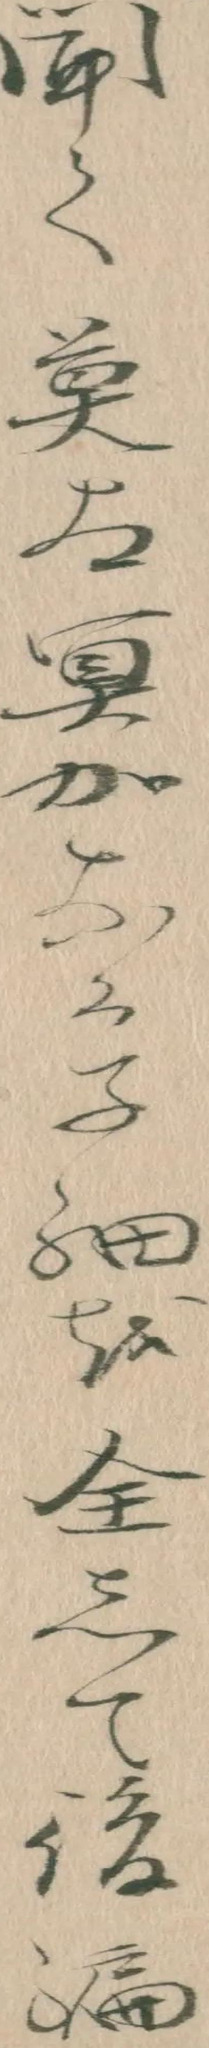聞て莫太冥加なる子細を全して後編
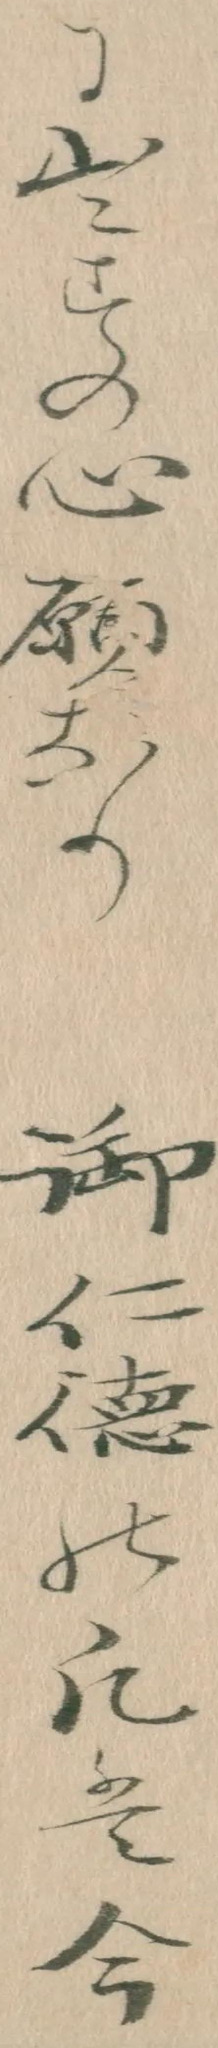に出すの心願なり御仁徳の凡は今
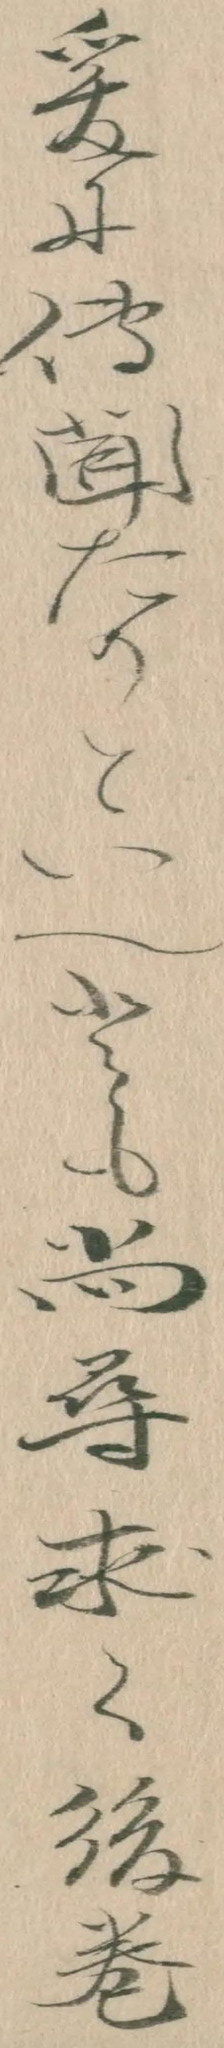爰に伝聞たりといへとも尚尋求て後巻
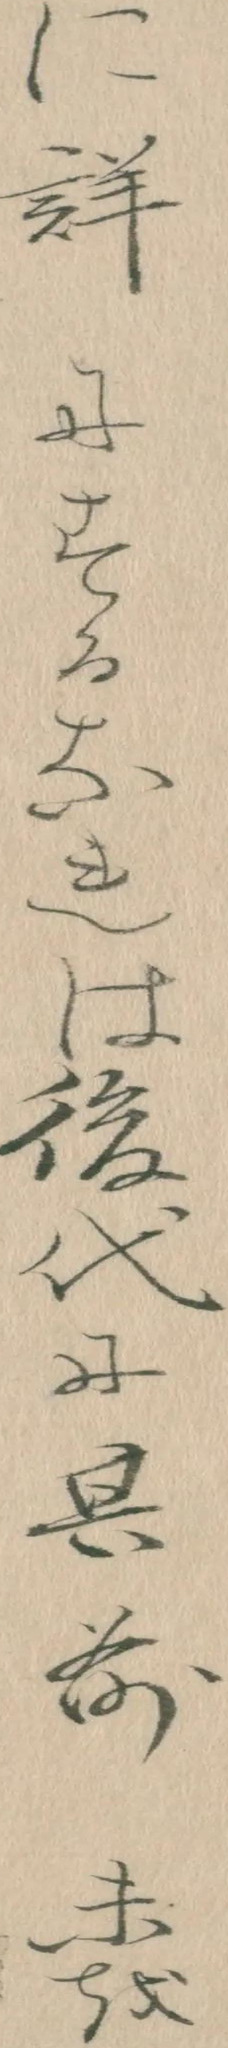に詳にするなれは後代に其前未を
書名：俗語之種. [6]
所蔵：国立国会図書館 National Diet Library, JAPAN
